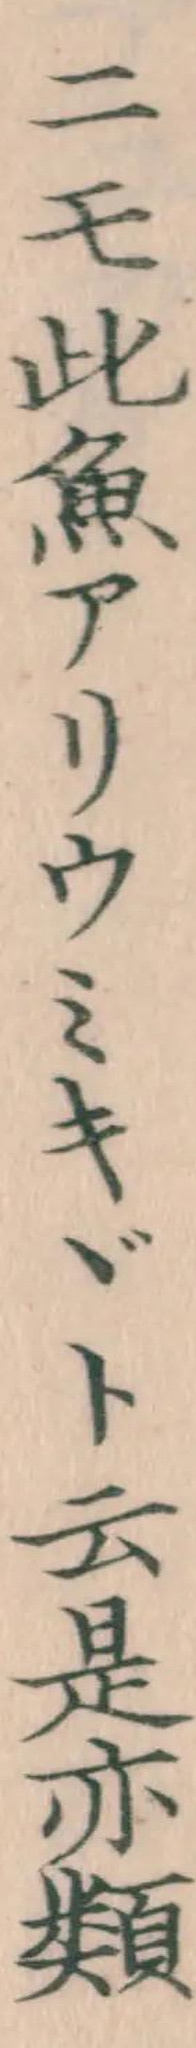ニモ此魚アリウミキヾト云是亦類
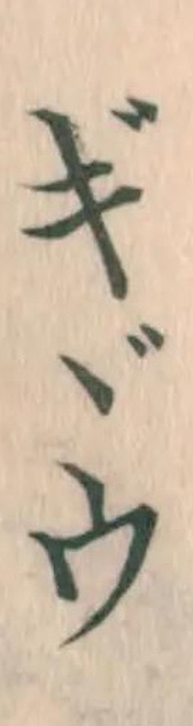ギヾウ

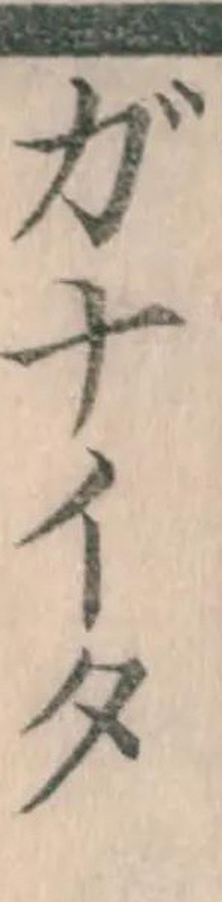ガナイタ
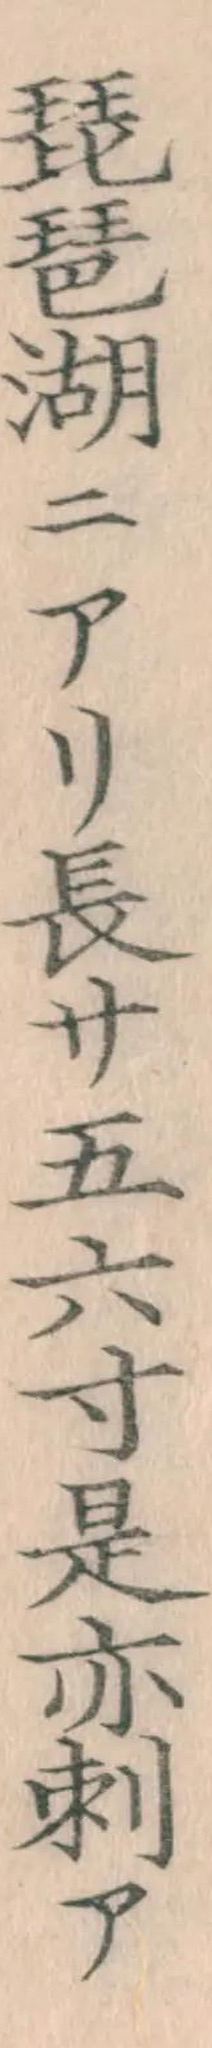琵琶湖ニアリ長サ五六寸是亦刺ア
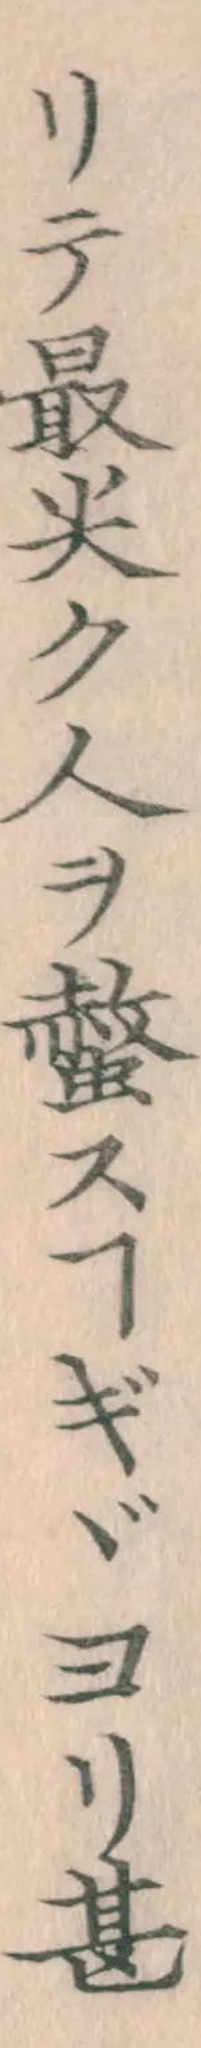リテ最尖ク人ヲ螫スヿギヾヨリ甚
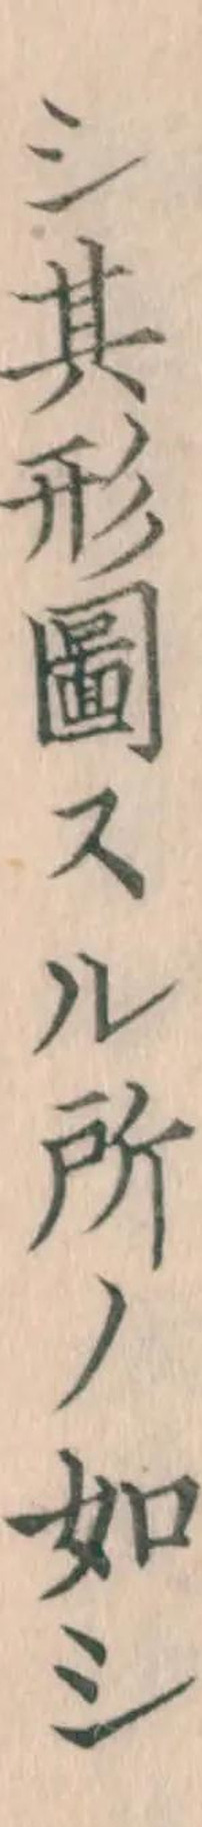シ其形図スル所ノ如シ
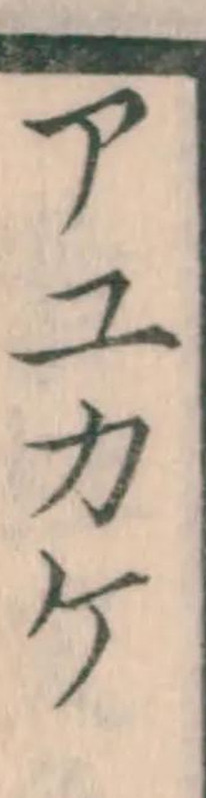アユカケ
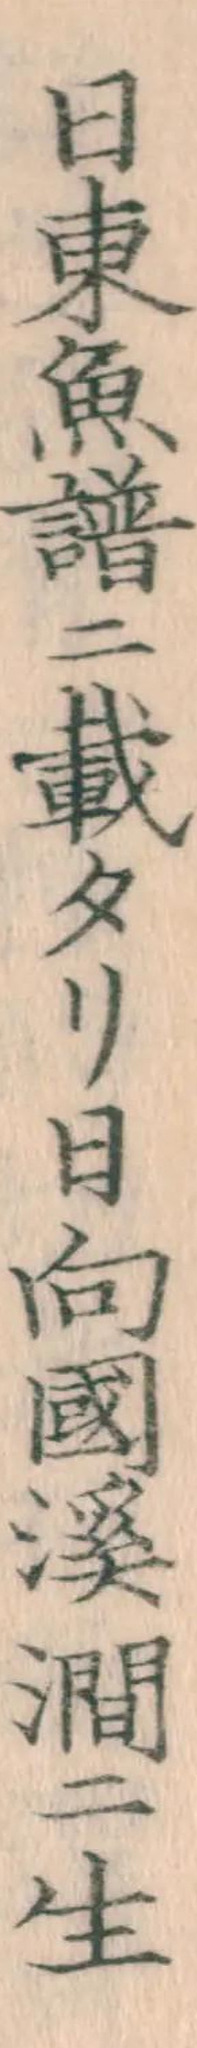日東魚譜ニ載タリ日向国渓澗ニ生
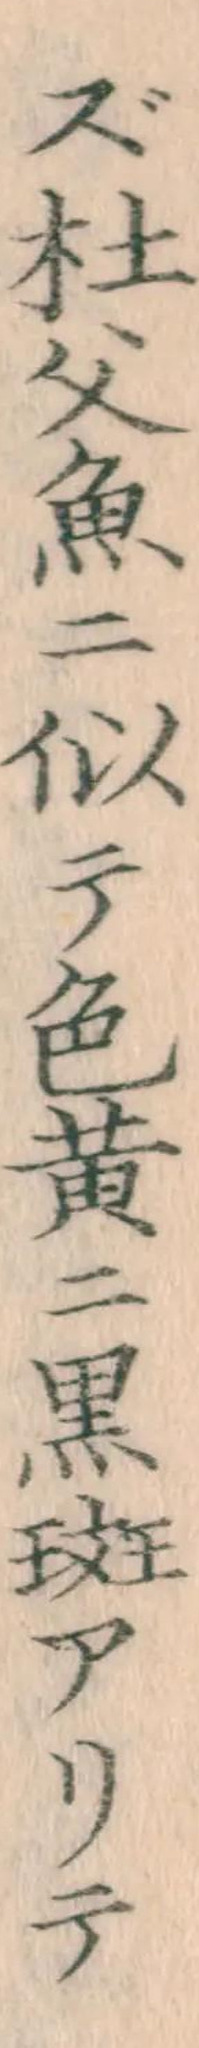ズ杜父魚ニ似テ色黄ニ黒斑アリテ
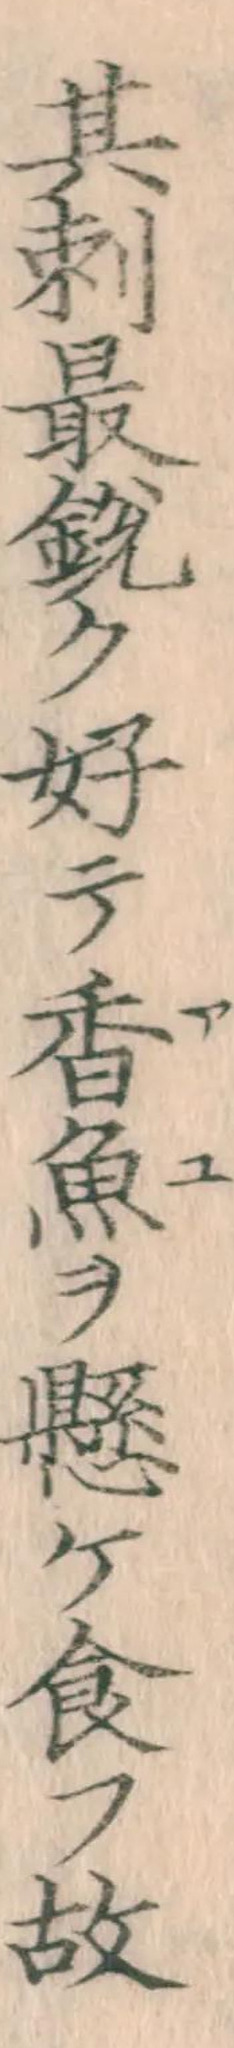其刺最鋭ク好テ香魚ヲ懸ケ食フ故
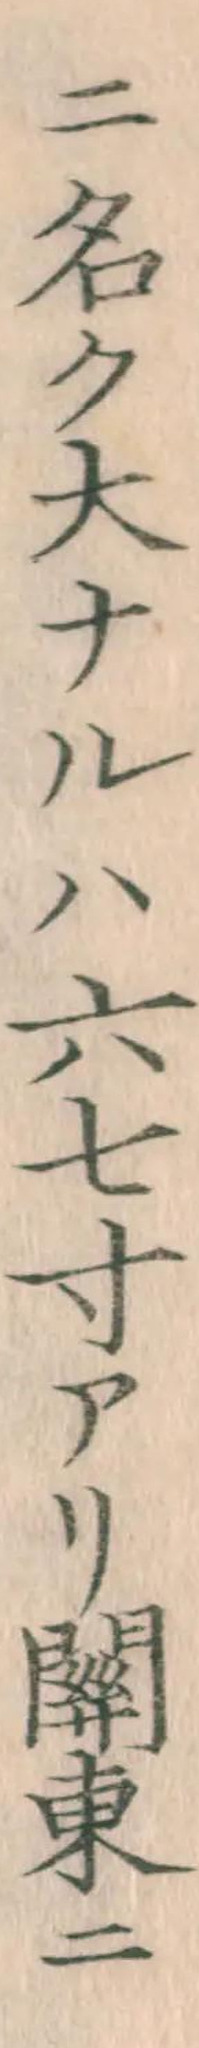ニ名ク大ナルハ六七寸アリ関東ニ
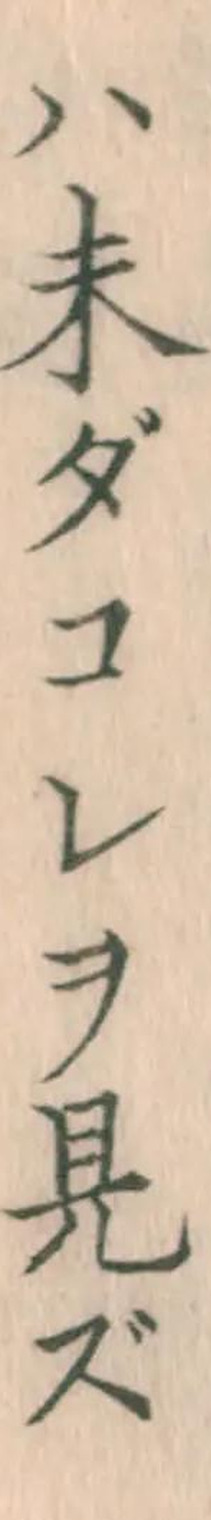ハ未ダコレヲ見ズ

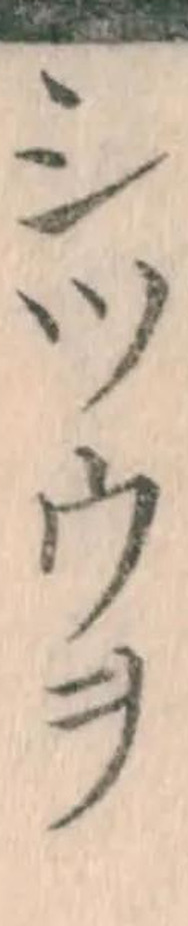シツウヲ
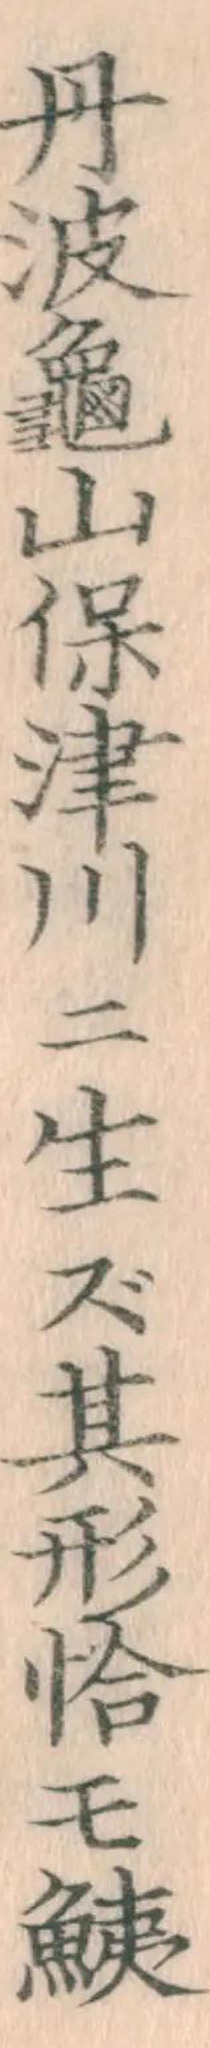丹波亀山保津川ニ生ズ其形恰モ鮧
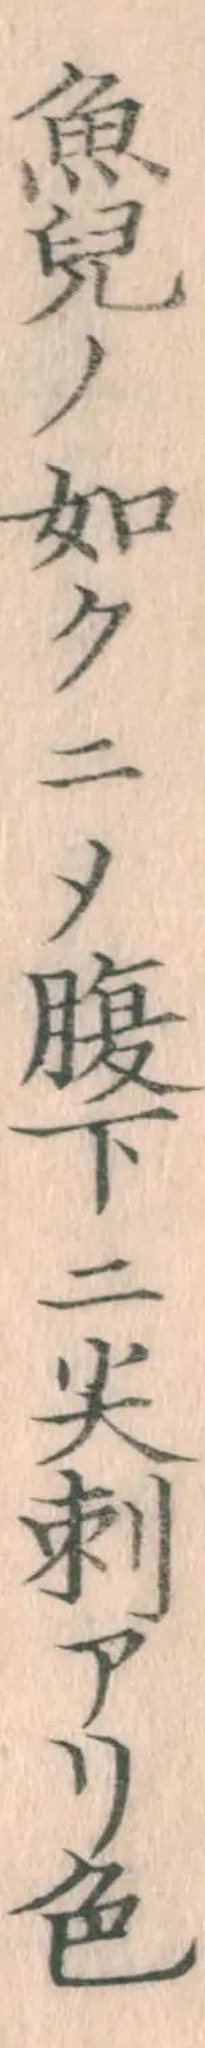魚児ノ如クニシテ腹下ニ尖刺アリ色
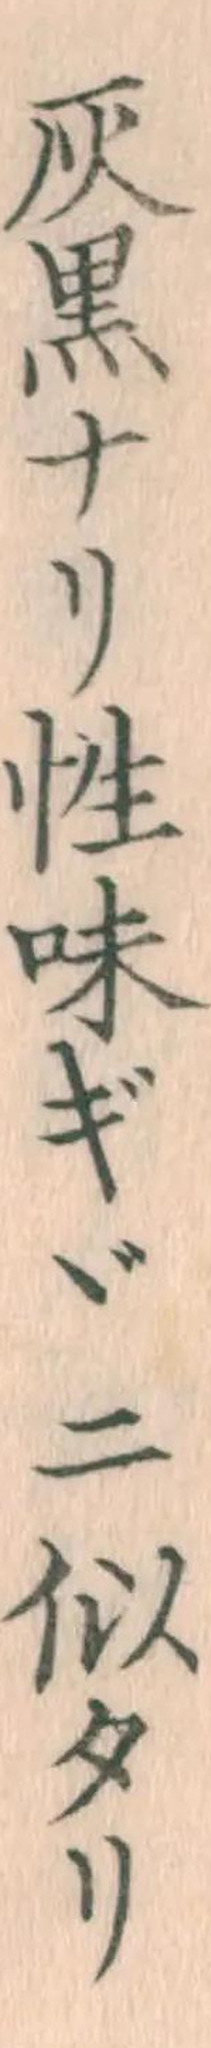灰黒ナリ性味ギヾニ似タリ
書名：皇和魚譜 2巻
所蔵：国立国会図書館 National Diet Library, JAPAN
